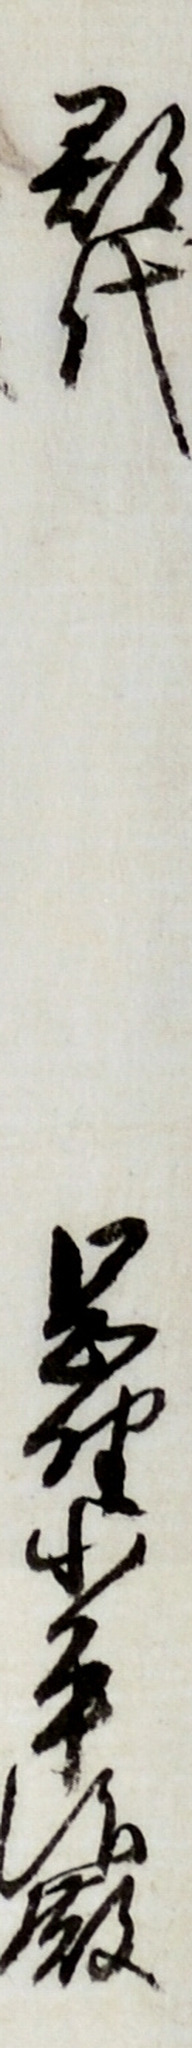郡代岡野小平治殿
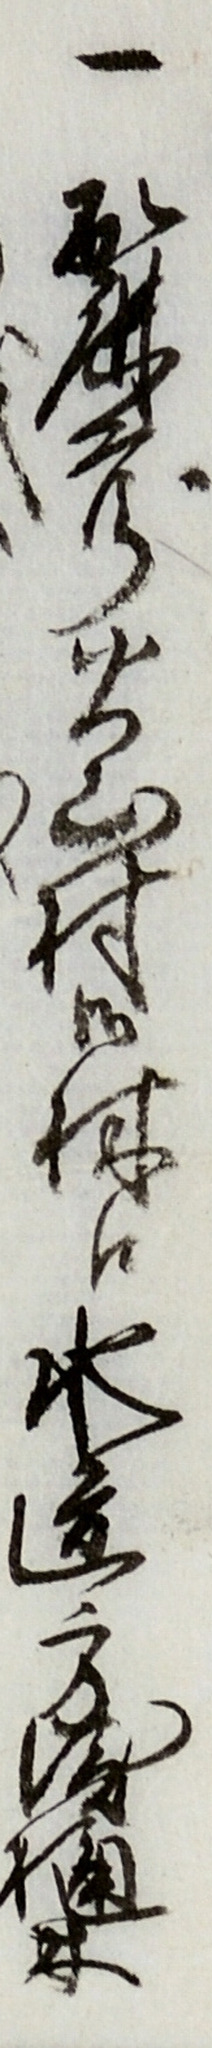一麗蔵火山村御林江水道方渡樋木
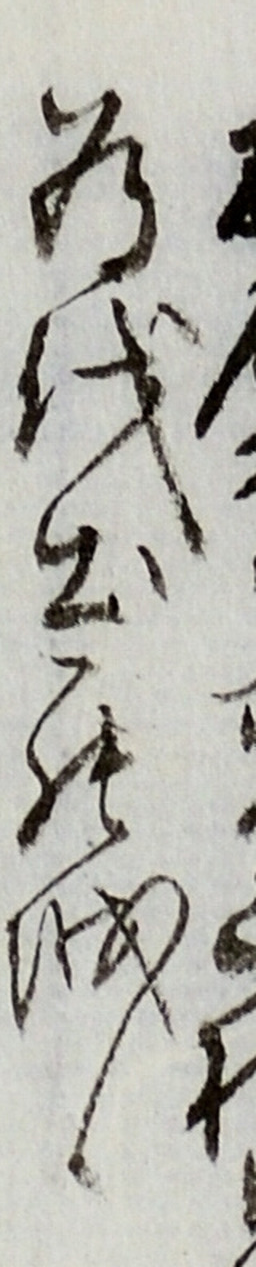為伐出罷越候
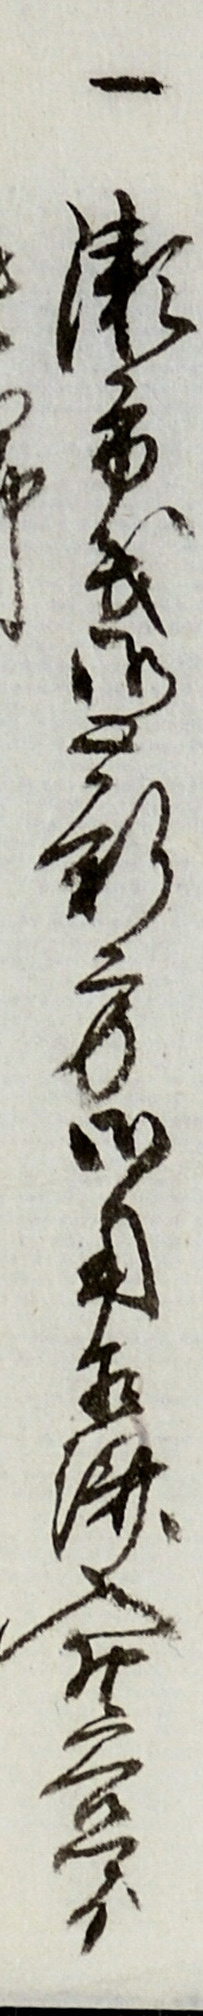一瀬市義御薪方御用相済入野谷郷ゟ
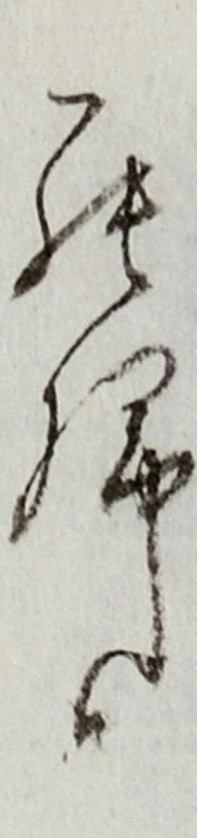罷帰候
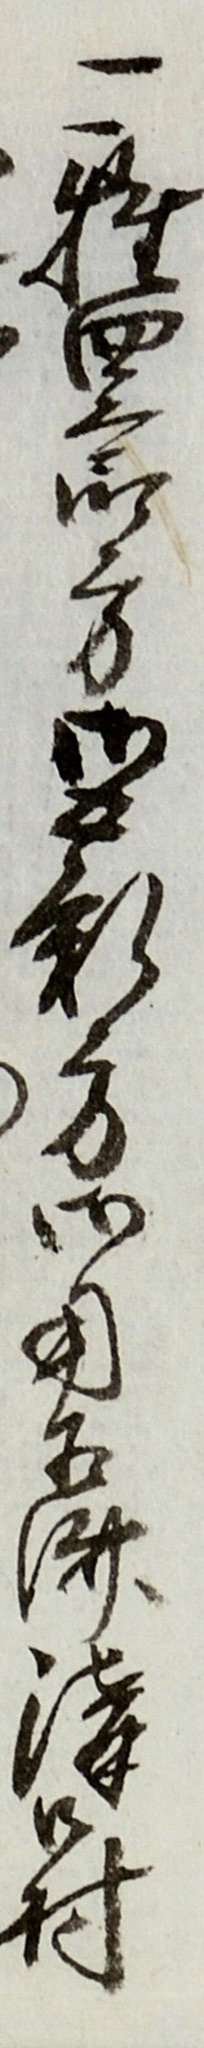一雅四郎方御薪方御用相済溝口村
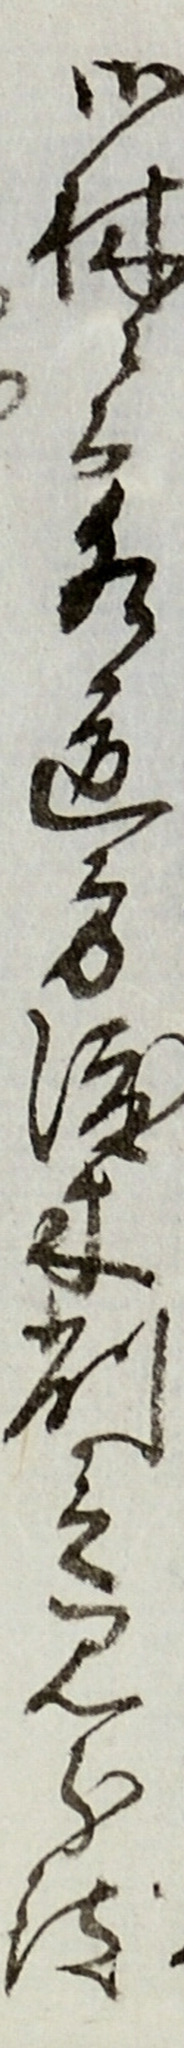御林ニ而水道方渡木削立見分致
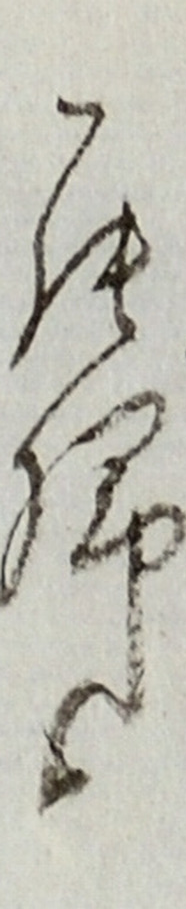罷帰候
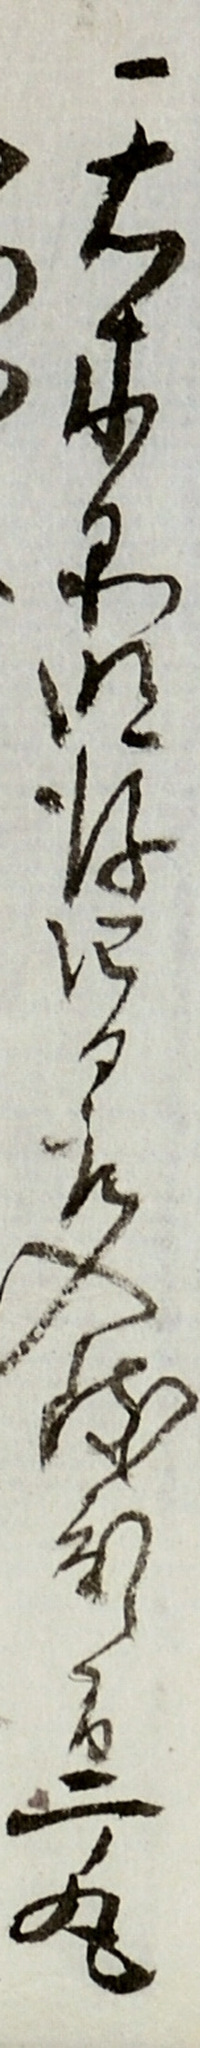一右木品明後四日取入致度候間二ノ丸
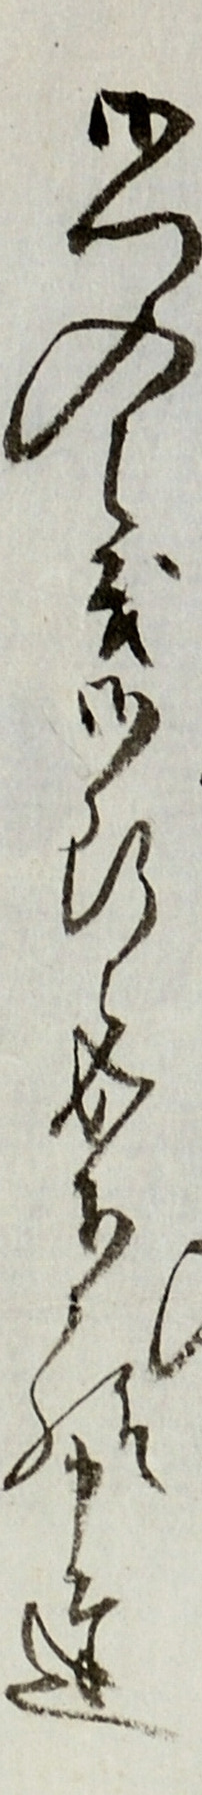御門入之義御断被成下候様申達
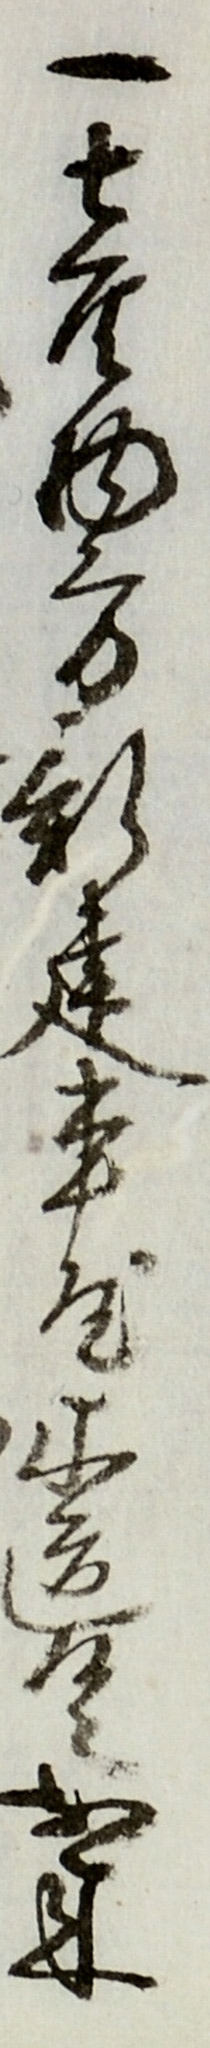一産物方新建車屋木道具出来
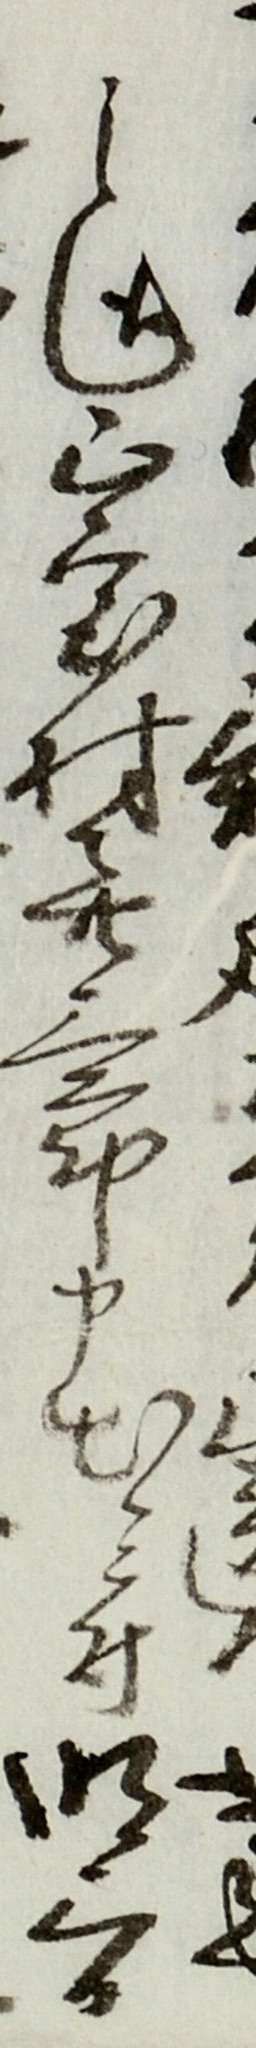候趣山室村喜三郎申出候ニ付明三日
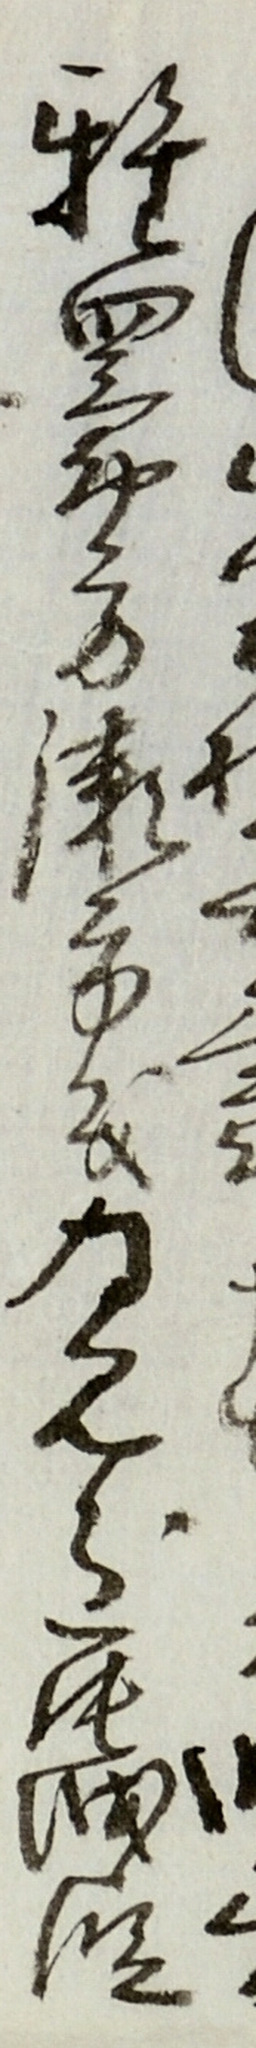雅四郎方瀬市義為見分罷越候段
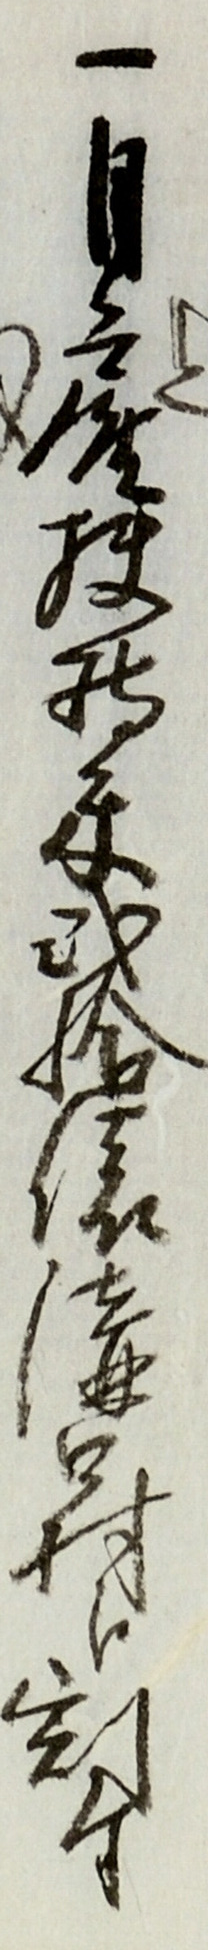一日雇扶持米弐拾俵溝口村江割付
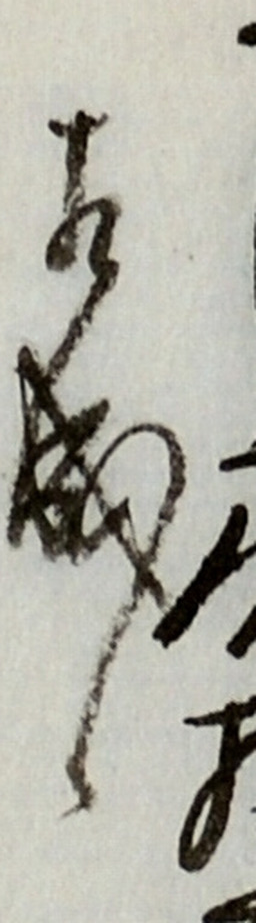相成候
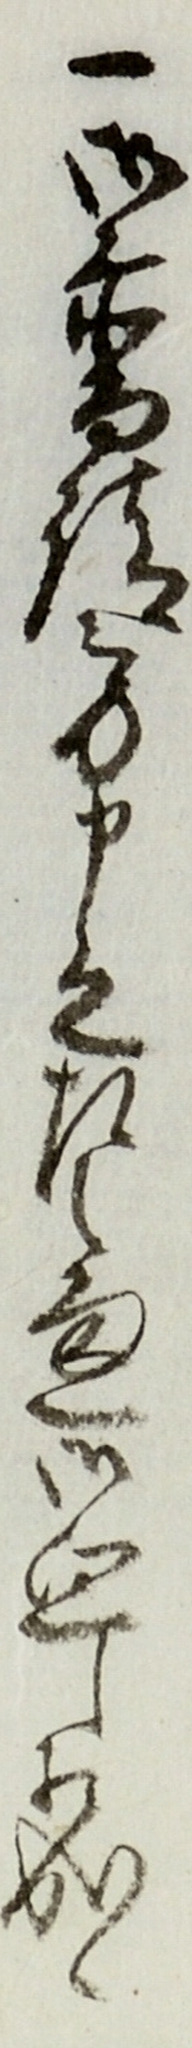一御普請方申立左之通御廻し相成候
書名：御山方御薪方諸事御用留
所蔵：伊那市立高遠町図書館・合同会社AMANE
